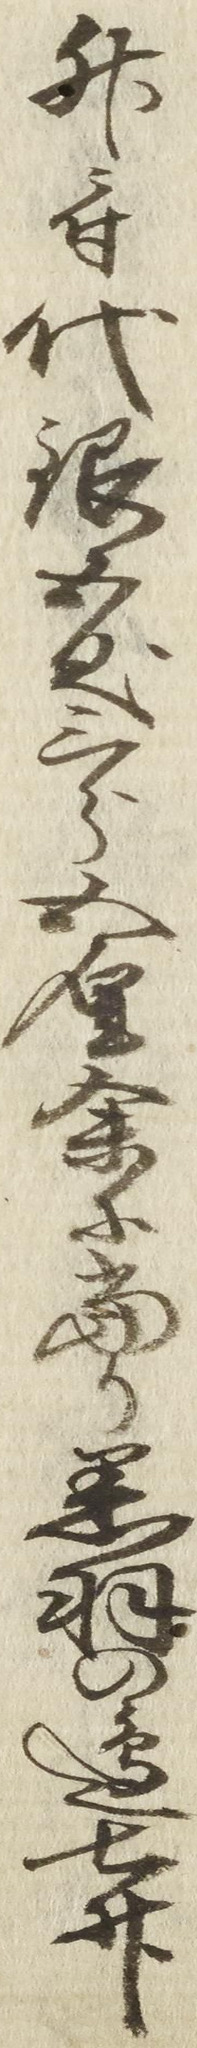升ニ付代銀五匁三分五厘余に当り黒羽の辺七升
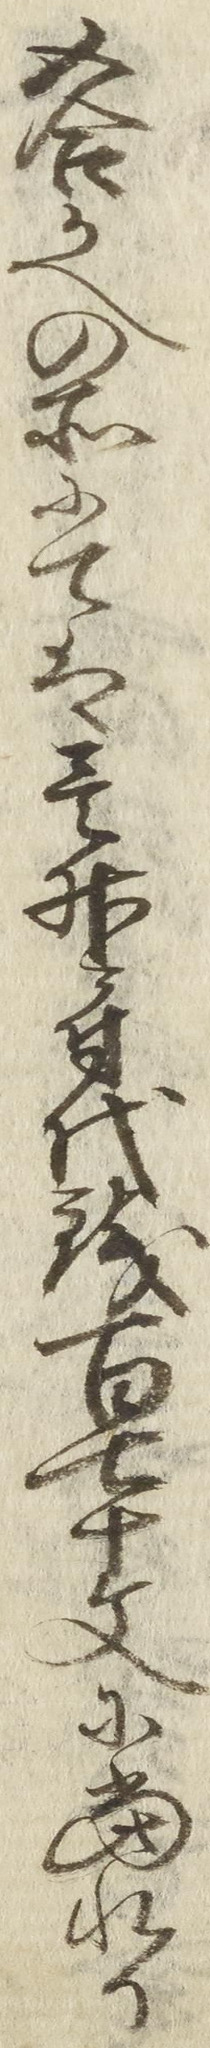五合かへの所にては壱升ニ付代銭百七十文に当れり

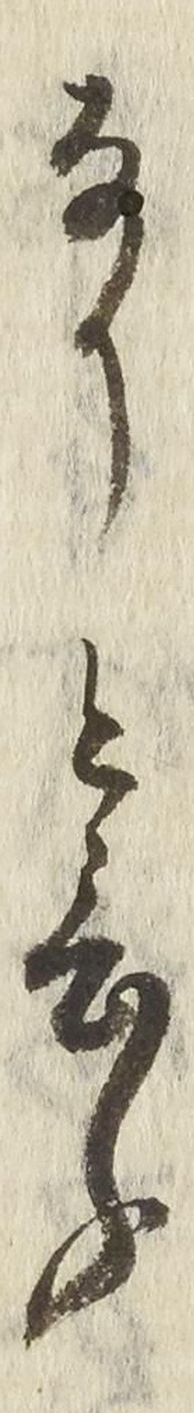なりと言ふ
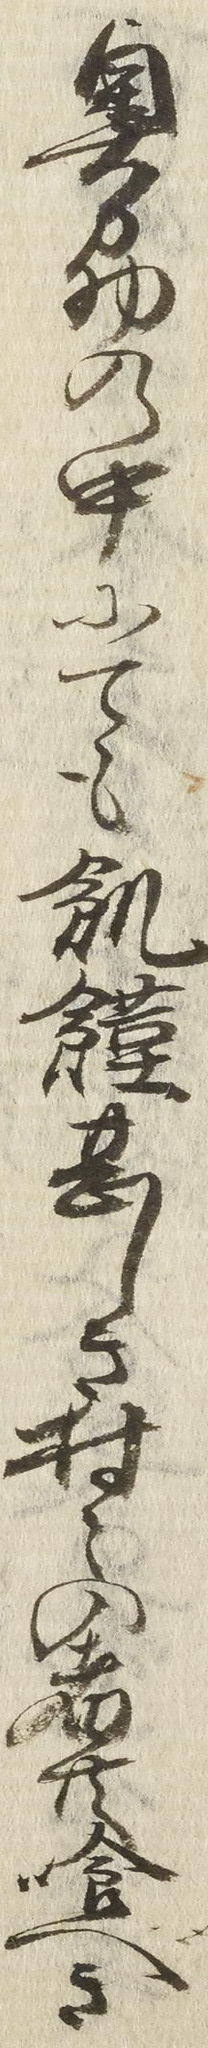奥州の中にても飢饉甚しき村〻の者共喰べき
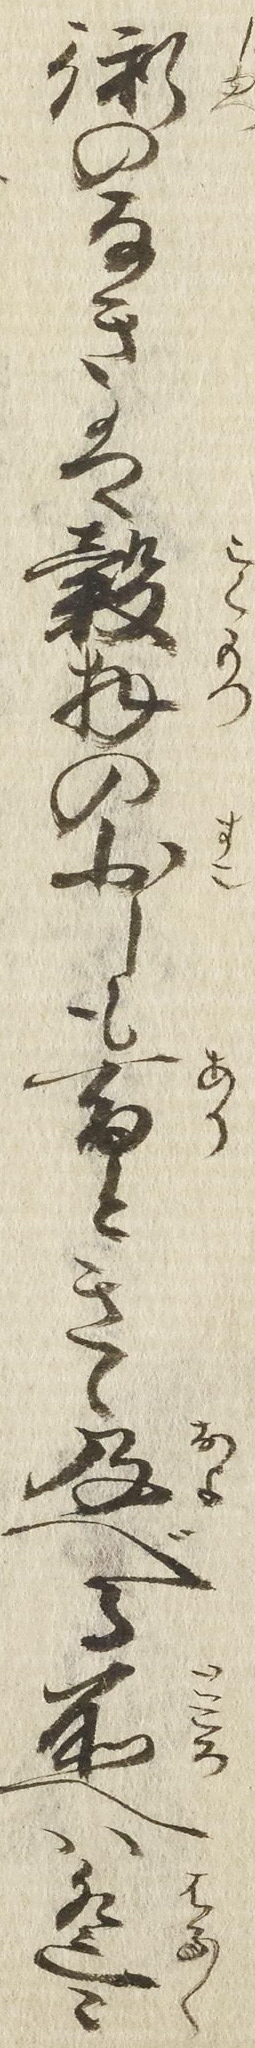術のなきは穀物の少しも有ときゝ及べる所へは遥〻
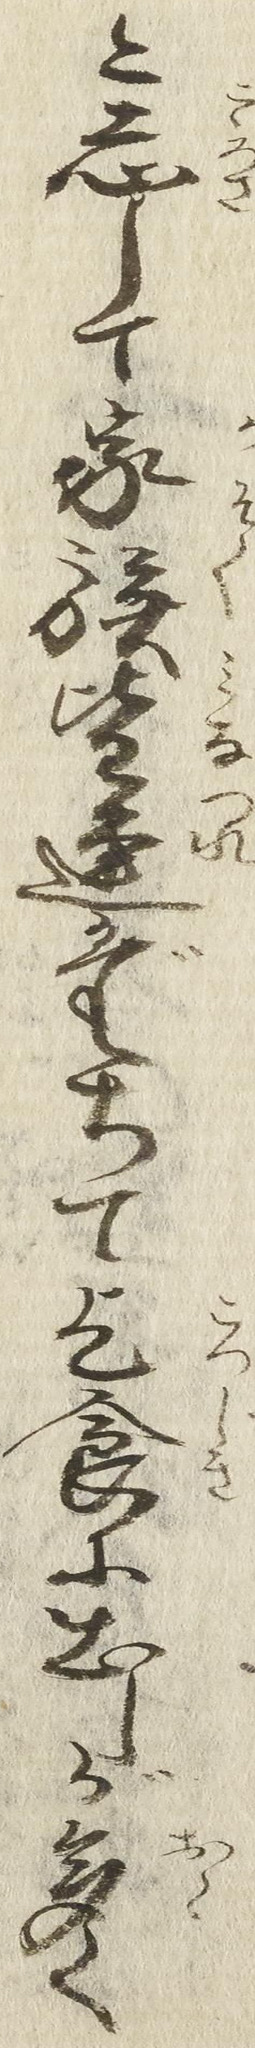と志して家族皆連だちて乞食に出しが多く
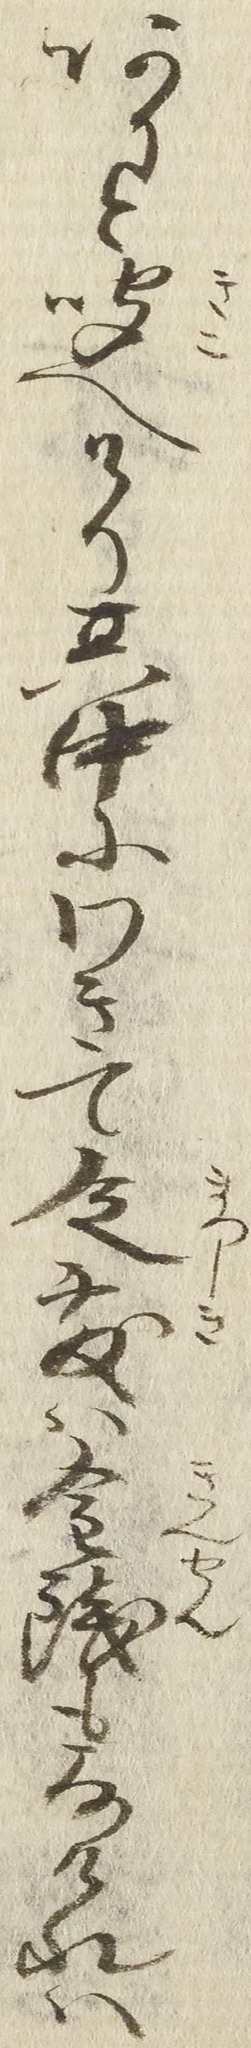ありと聞へけり其中にわきて貧敷は金銭もなけれは
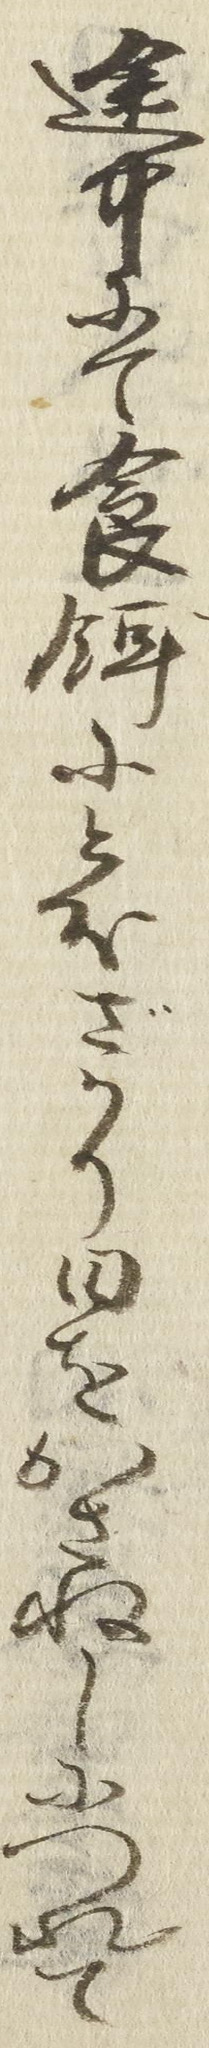途中ニ而食餌にとほざかり日をかさねしにつれて
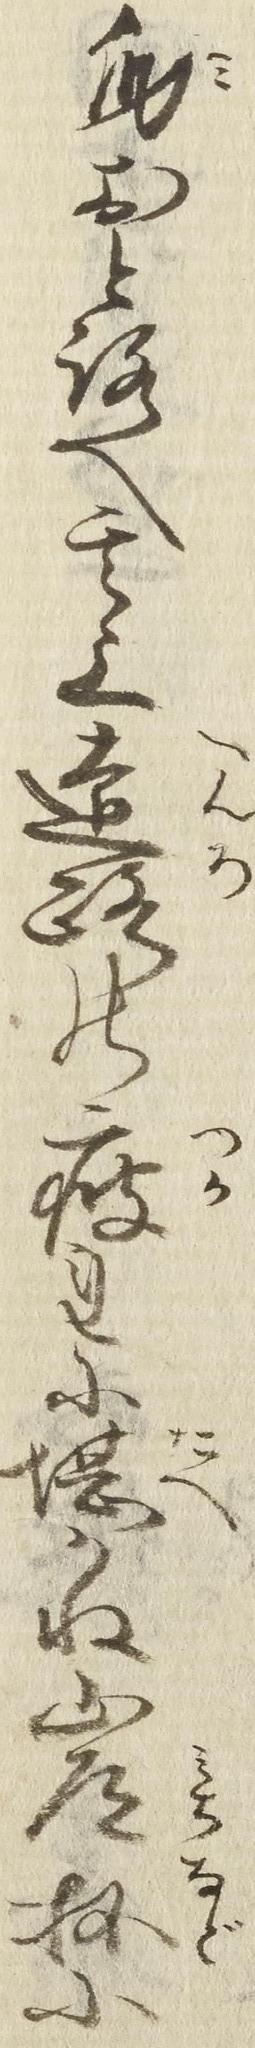身おとろへ其上遠路の疲れに堪かね山道抔に
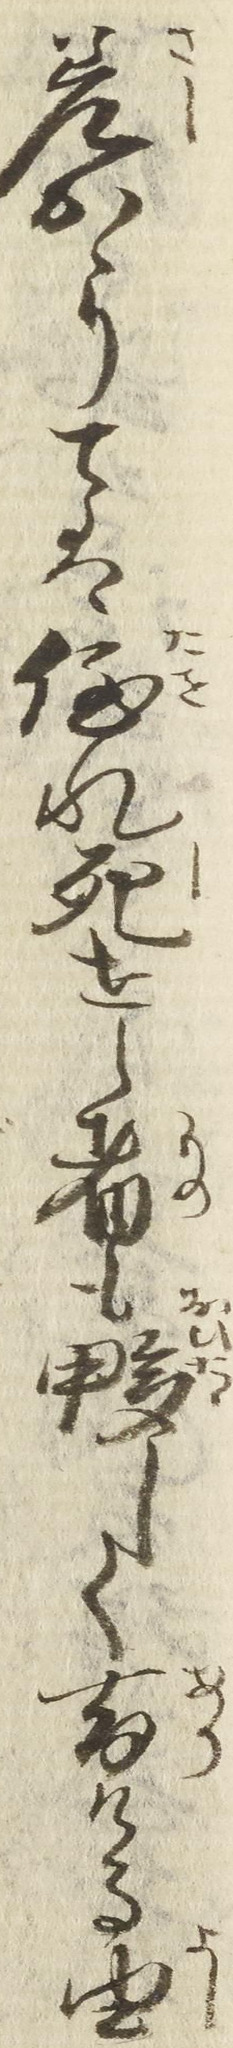差かゝりては倒れ死せし者も夥しく有ける由
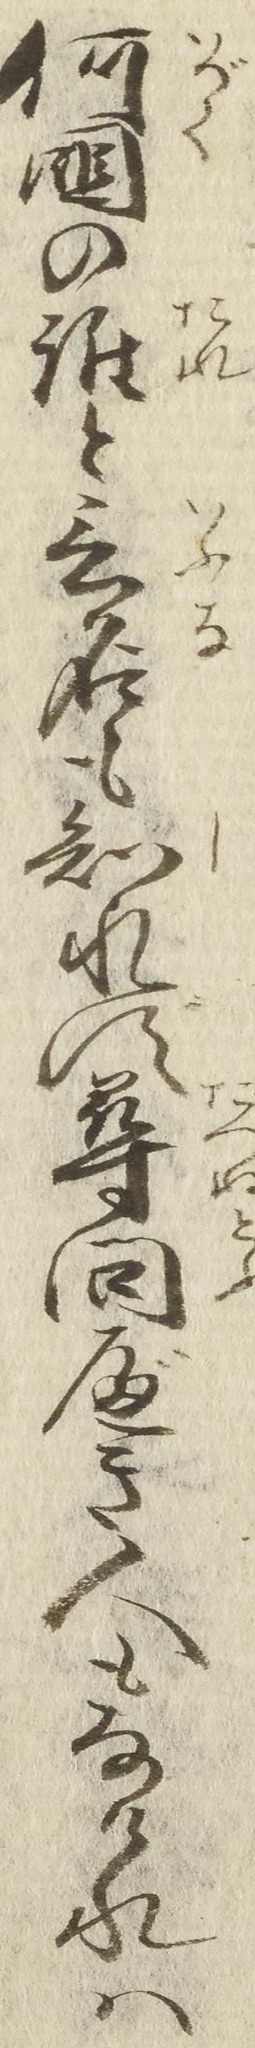何国の誰と言名も知れず尋問べき人もなけれは
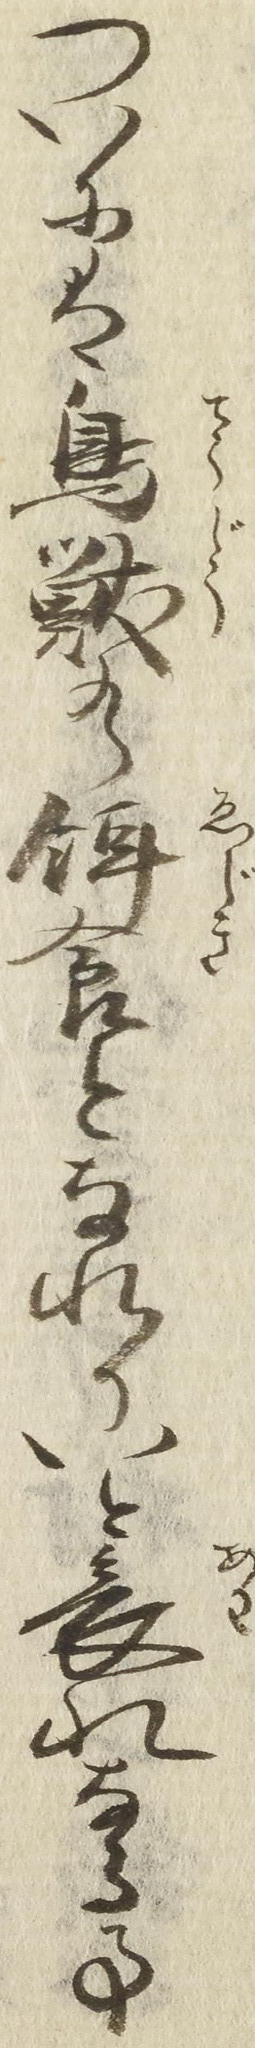ついには鳥獣の餌食となれりいと哀れなる事
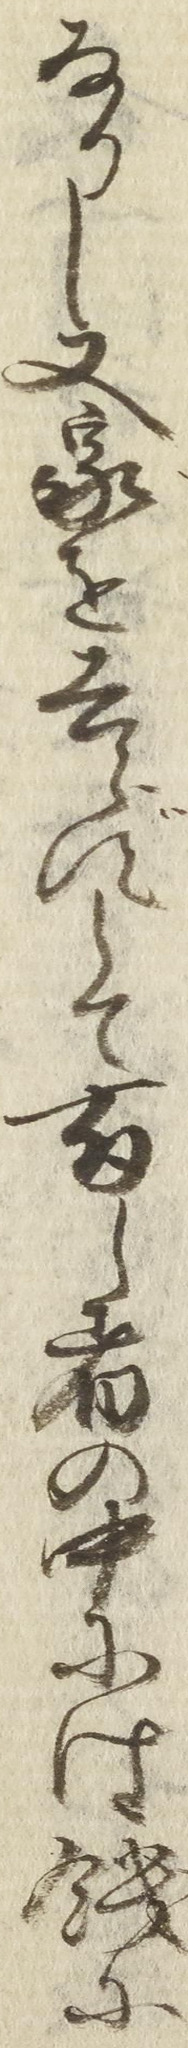なりし又家を去らずして有し者の中には餓に
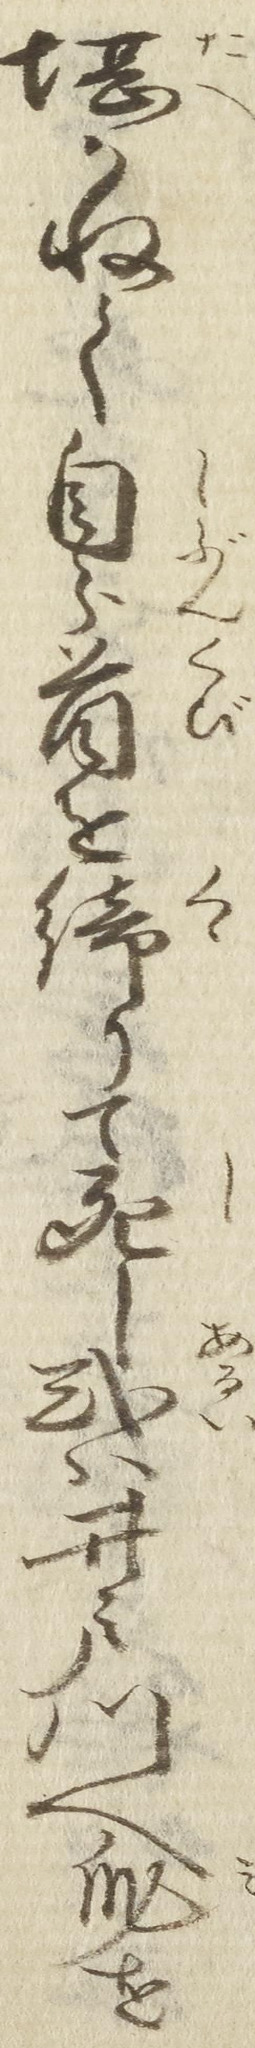堪かねて自分首を締りて死し或は井戸川へ身を
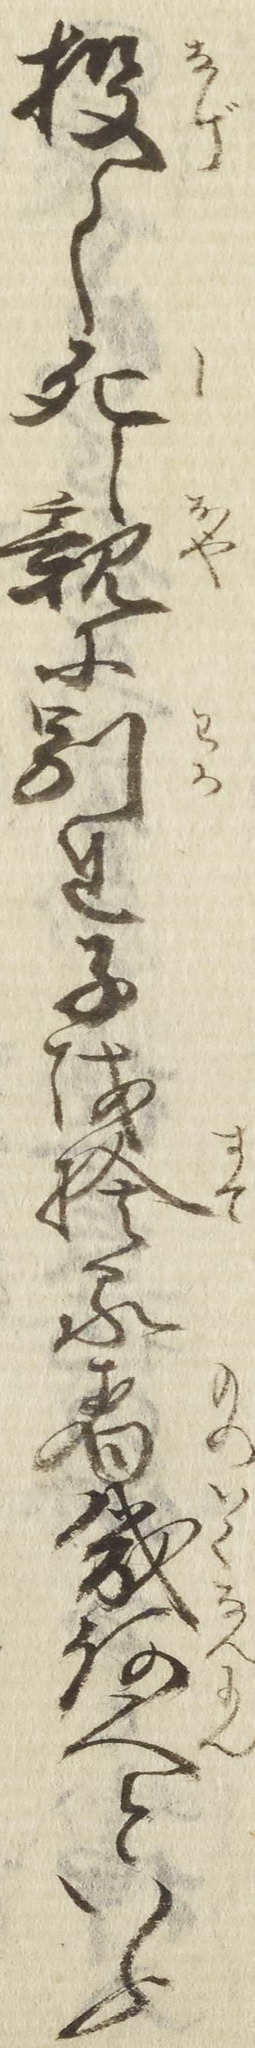投て死し親に別れ子を捨る者幾何人といふ
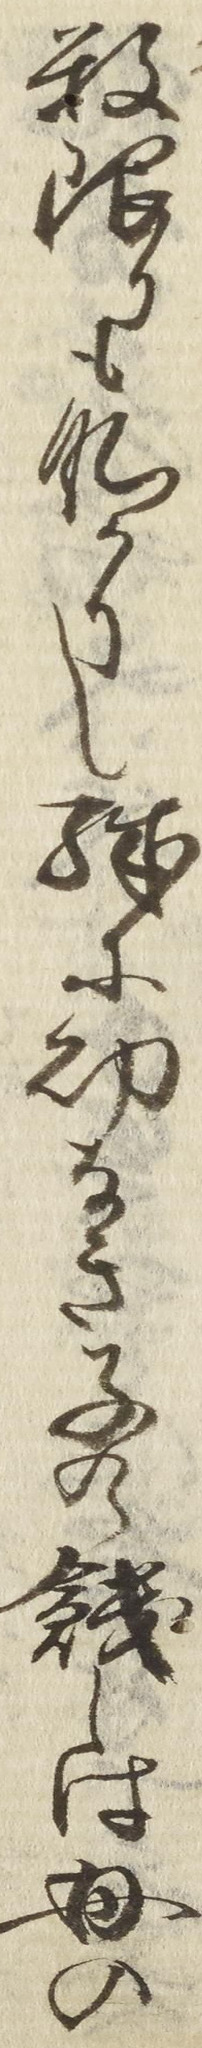数限りもなかりし殊に幼なき子の餓しは母の
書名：天明奇畧　全
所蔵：東京大学地震研究所図書室 Earthquake Research Institute Library, The University of Tokyo, JAPAN
